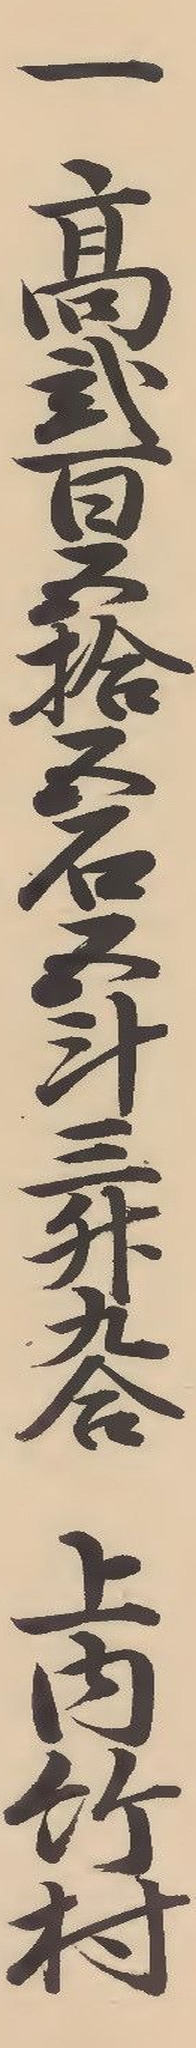一高弐百五拾五石五斗三升九合上内竹村
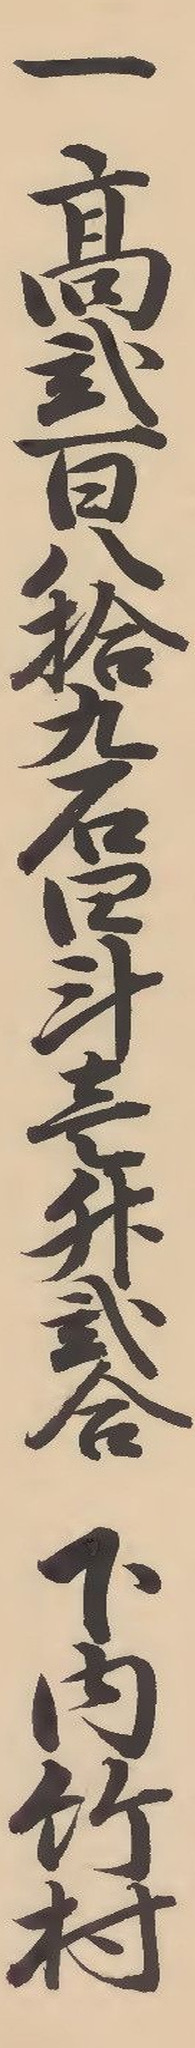一高弐百八拾九石四斗壱升弐合下内竹村

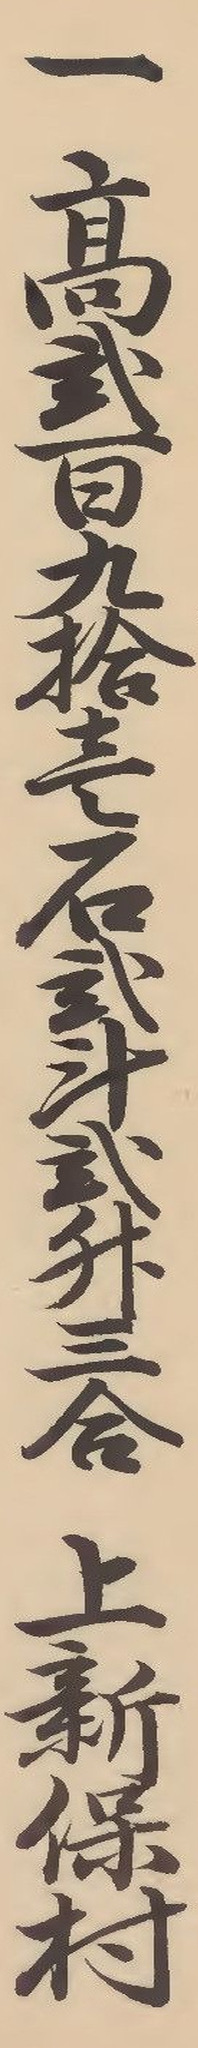一高弐百九拾壱石弐斗弐升三合上新保村
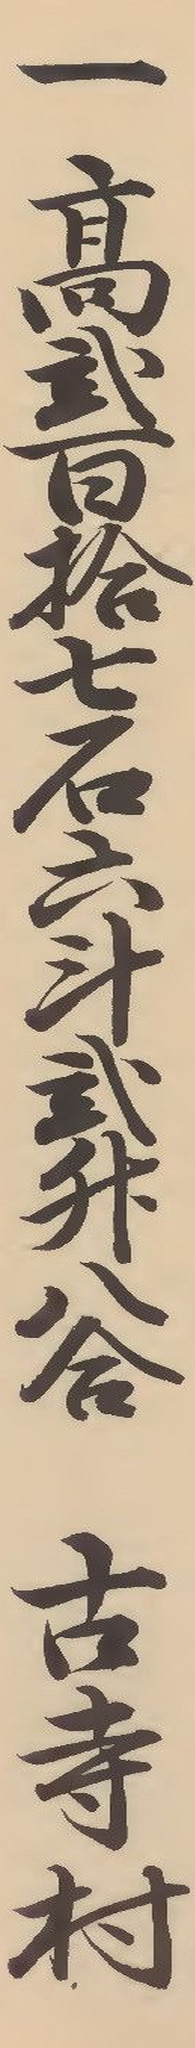一高弐百拾七石六斗弐升八合古寺村
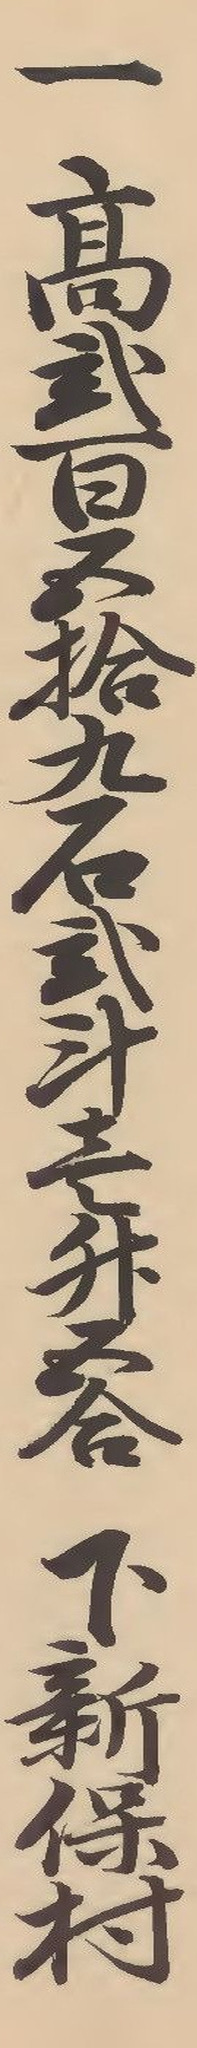一高弐百五拾九石弐斗壱升五合下新保村
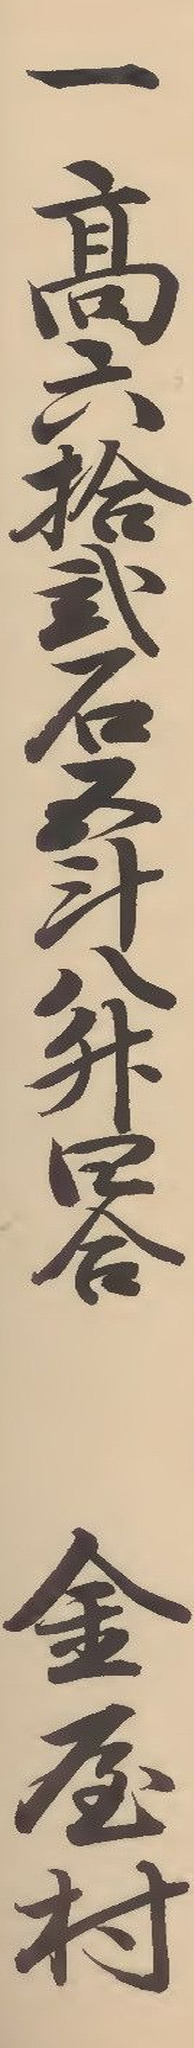一高六拾弐石五斗八升四合金屋村
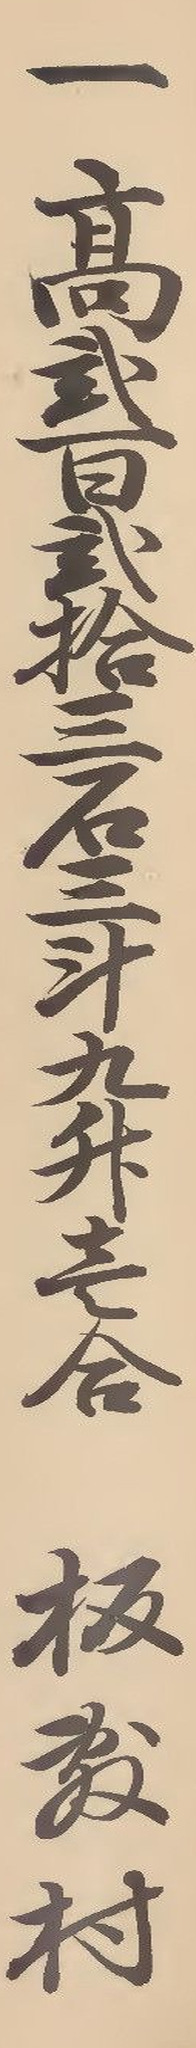一高弐百弐拾三石三斗九升壱合板敷村
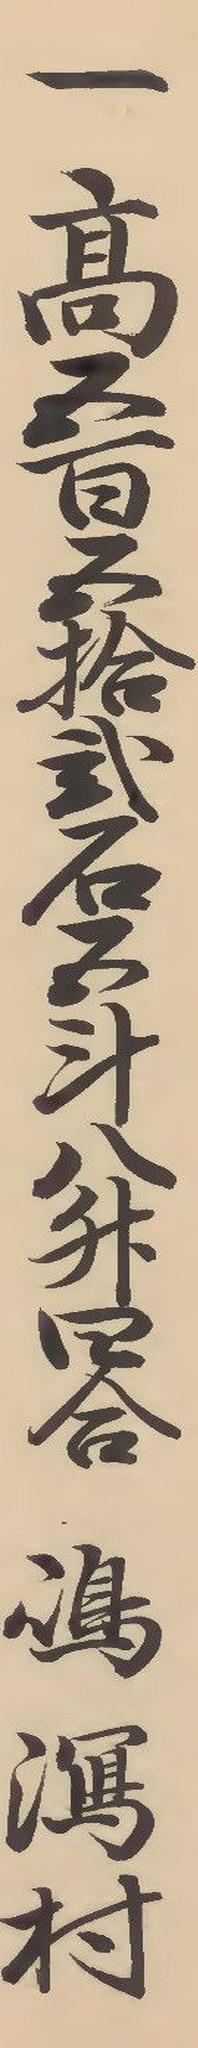一高五百五拾弐石五斗八升四合島潟村
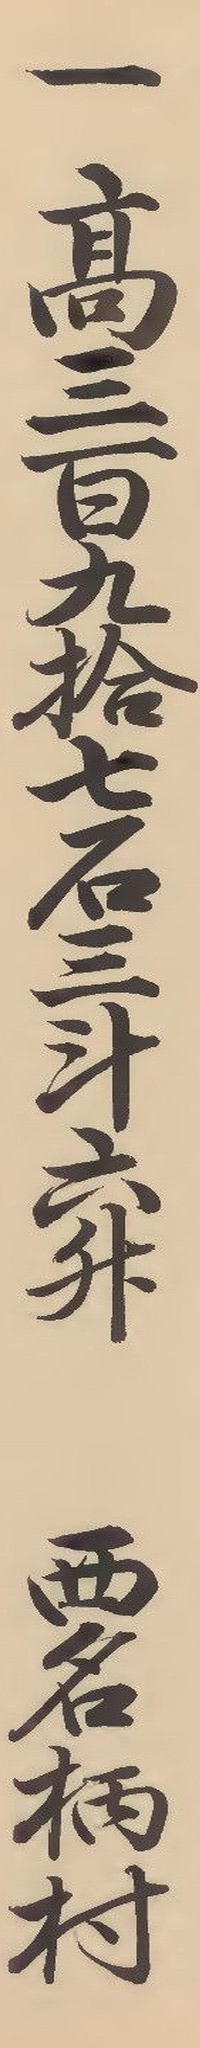一高三百九拾七石三斗六升西名柄村
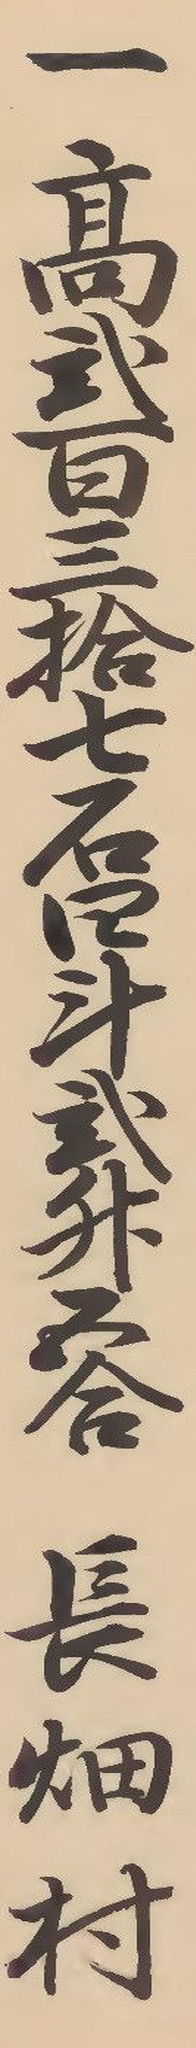一高弐百三拾七石四斗弐升五合長畑村

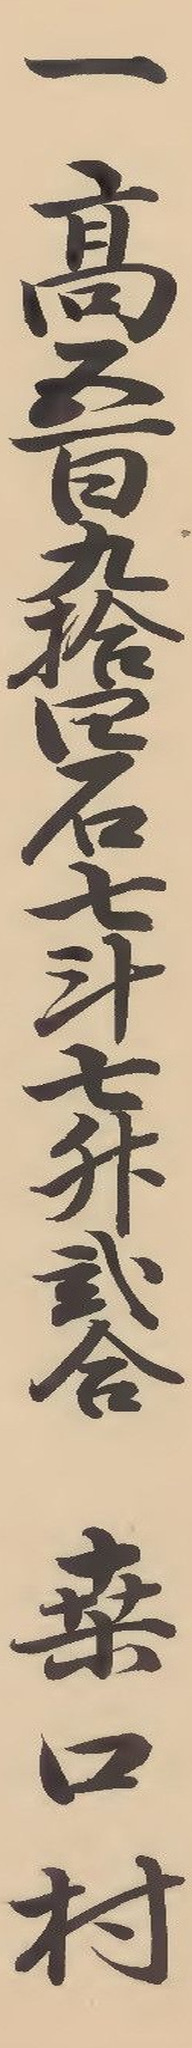一高五百九拾四石七斗七升弐合桑口村
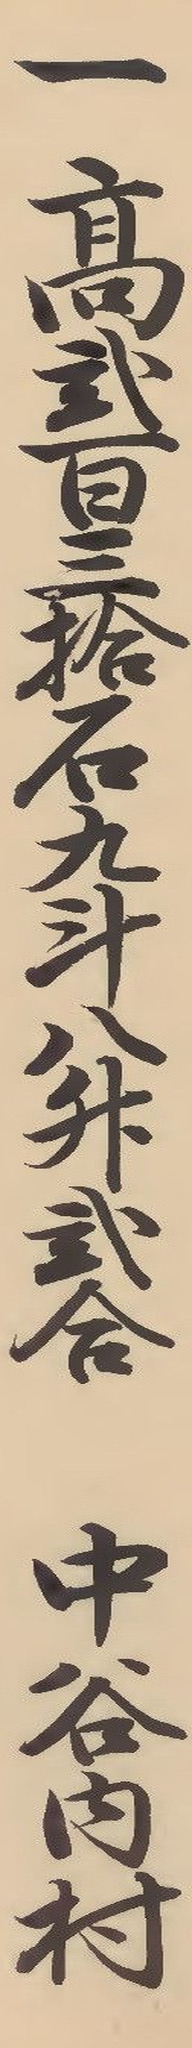一高弐百三拾石九斗八升弐合中谷内村
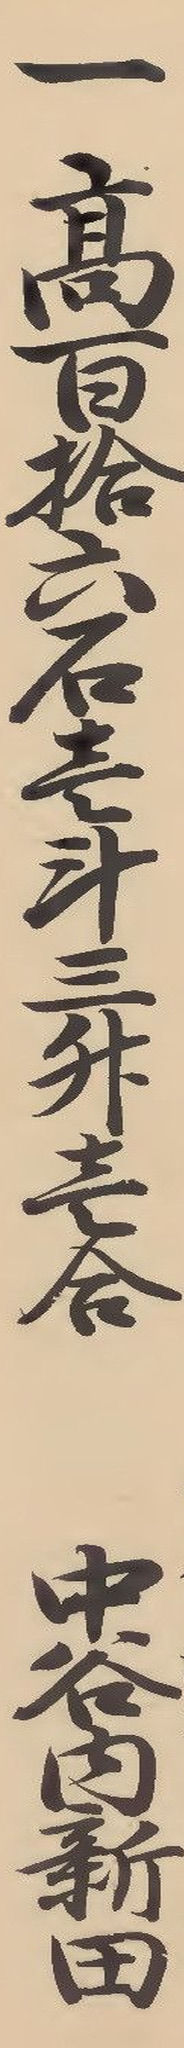一高百拾六石壱斗三升壱合中谷内新田
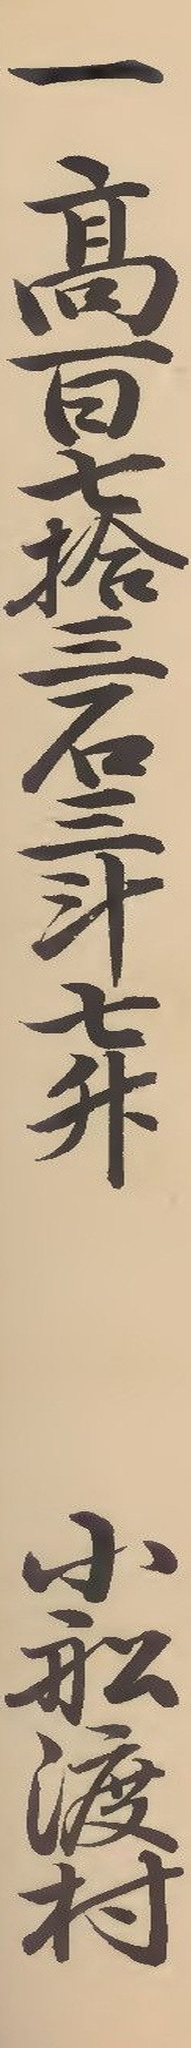一高百七拾三石三斗七升小船渡村
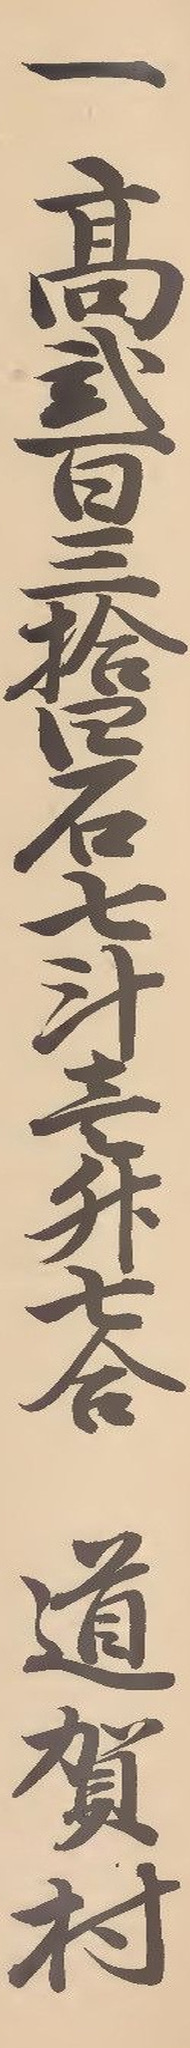一高弐百三拾四石七斗壱升七合道賀村
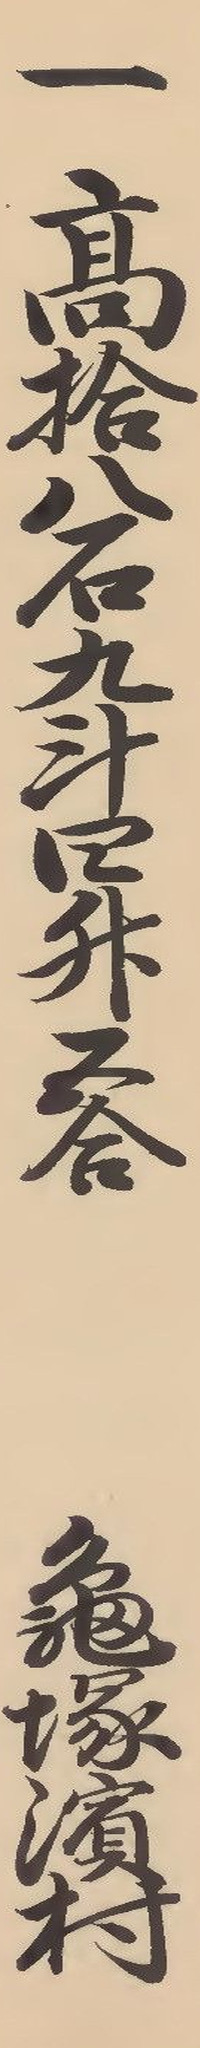一高拾八石九斗四升五合亀塚浜村
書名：越後国郷帳　下
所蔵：国立公文書館 National Archives of Japan
